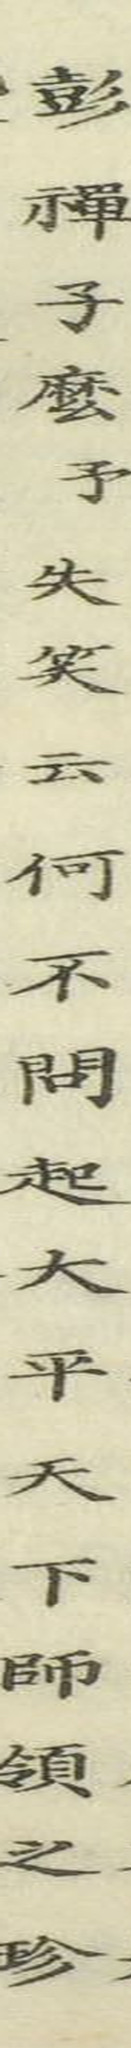彭禪子麼予失笑云何不問起大平天下師領之珍
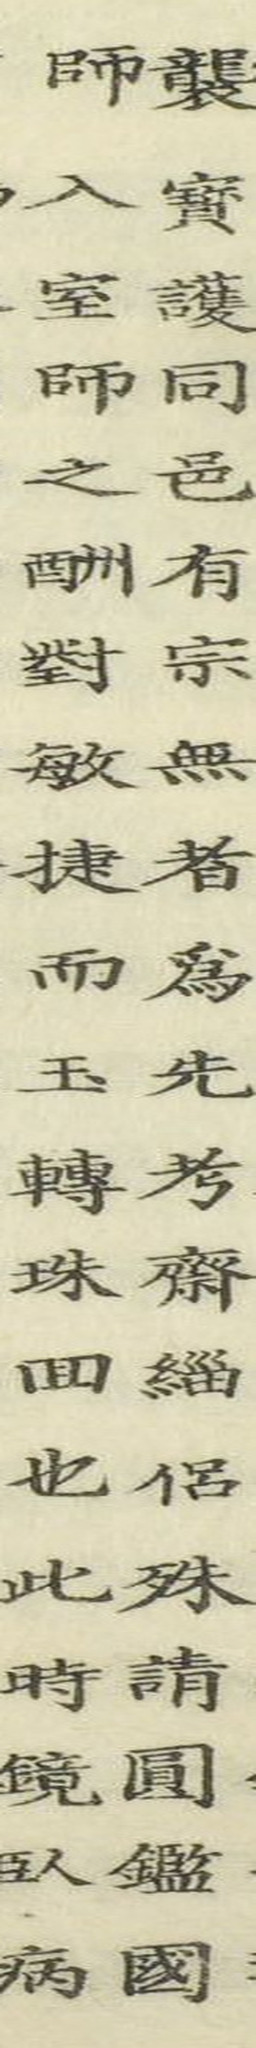師入室師之酬對敏捷而玉轉珠囬也此時鏡臥病
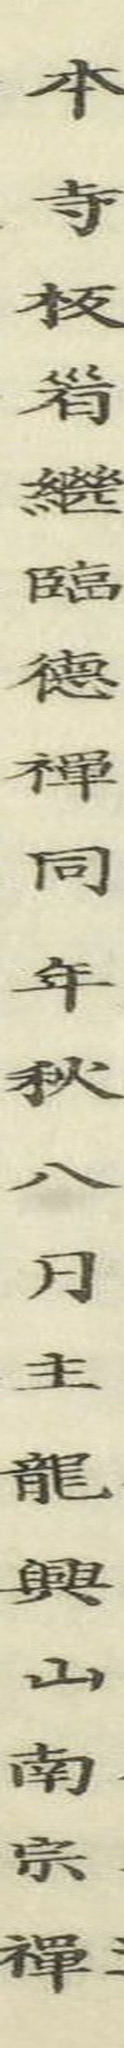本寺板繼臨德禪同年秋八月主龍興山南宗禪
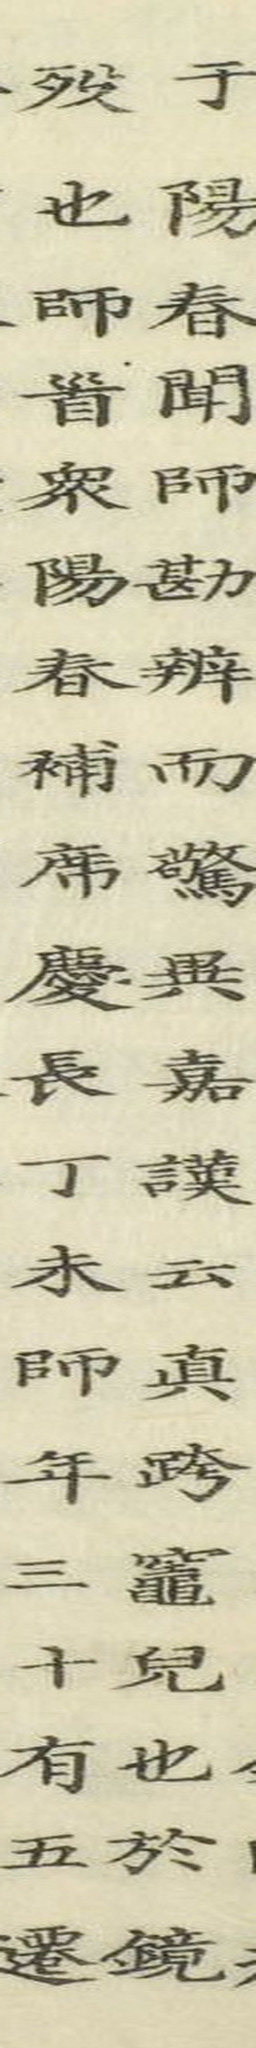殁也師𩠐衆陽春補席慶長丁未師年三十有五遷
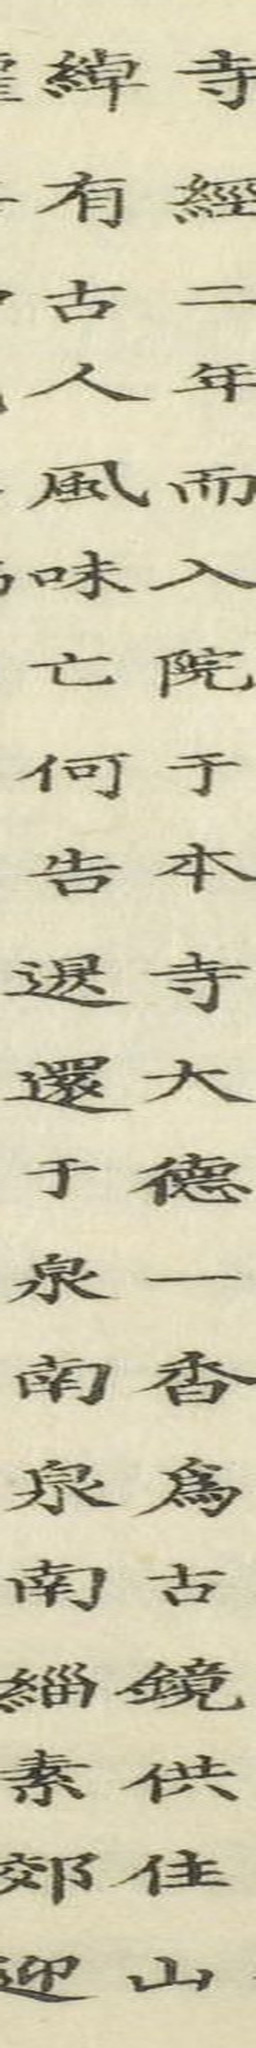綽有古人風味亡何告還于泉南泉南緇素郊迎
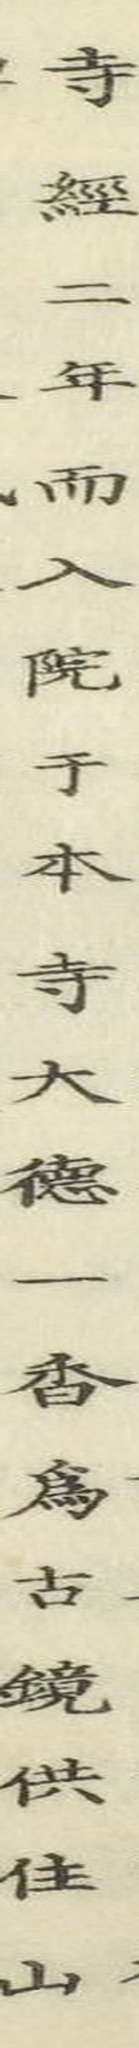寺經二年而入院于本寺大德一香爲古鏡供住山
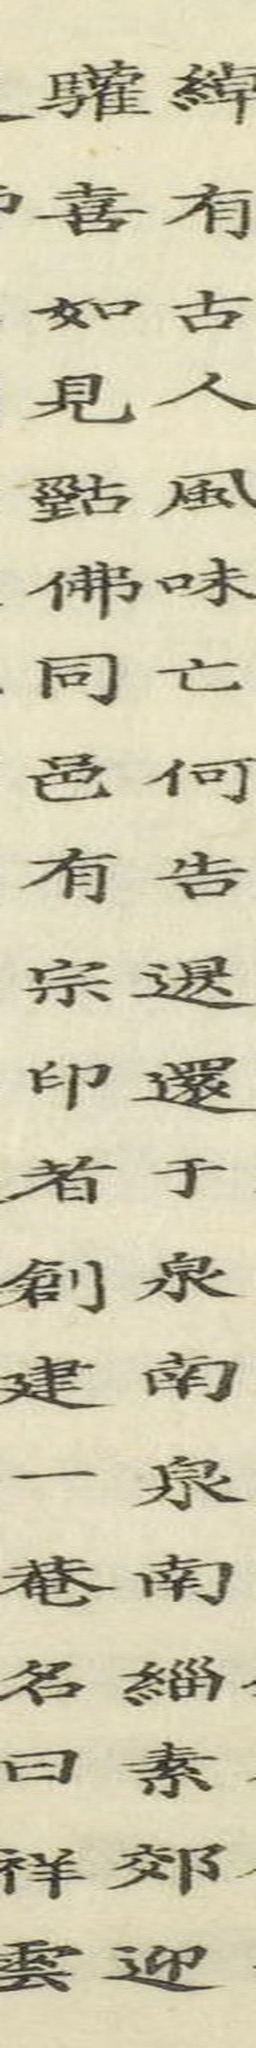驩喜如見佛同邑有宗印者創建一菴名曰祥雲
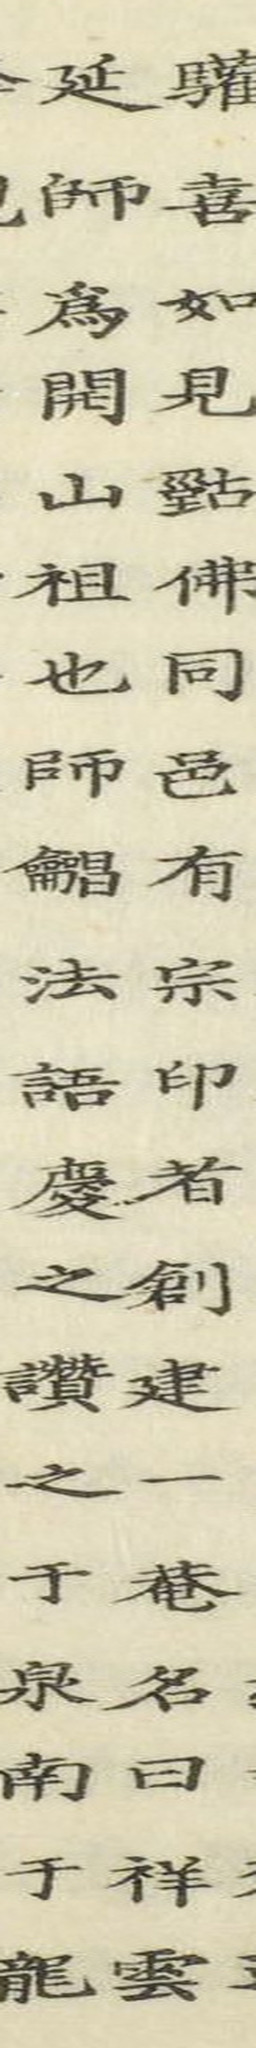延師爲開山祖也師𪛋法語慶之讚之于泉南于龍
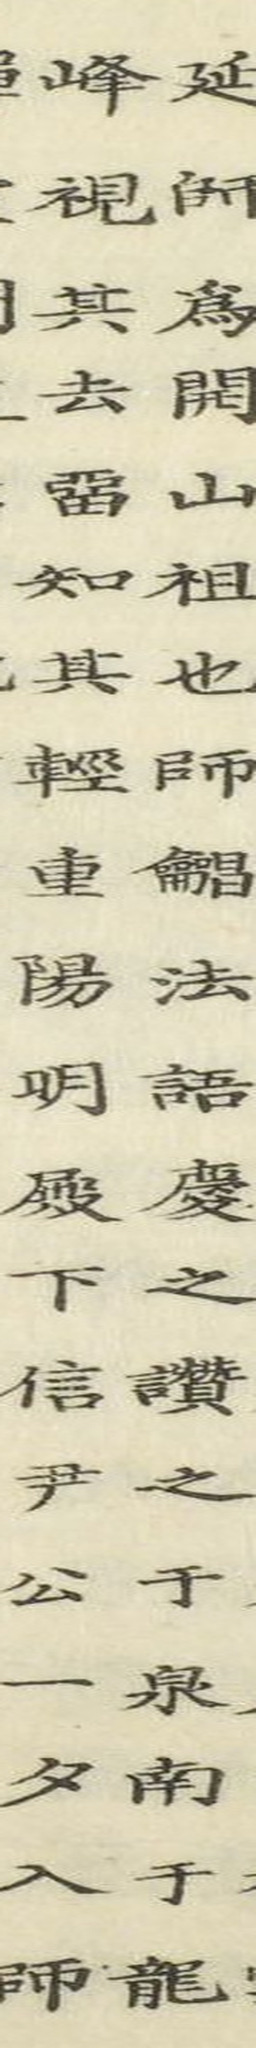峰視其去畱知其輕重陽殿下信尹公一夕入師
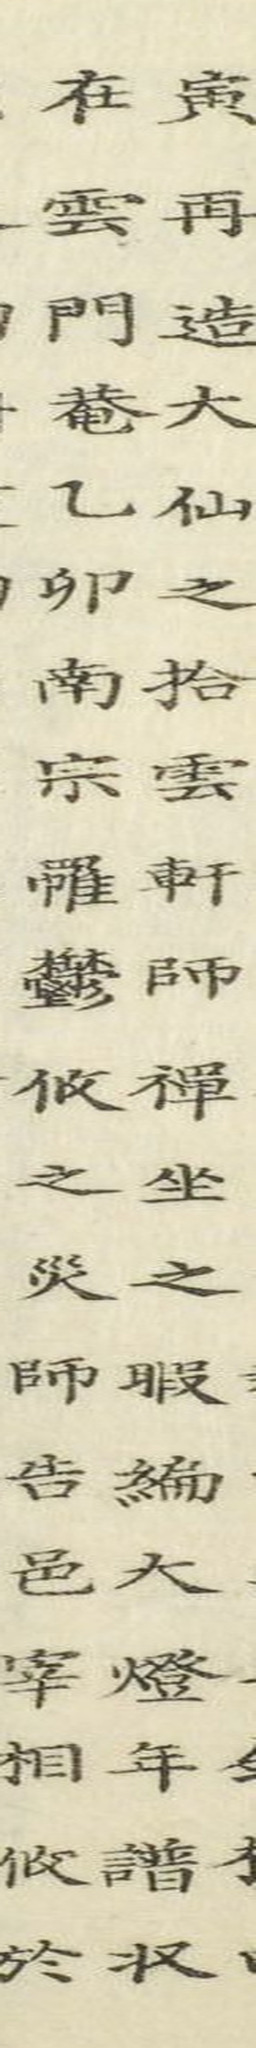在雲門菴乙卯南宗鬱攸之災師告邑宰相攸於
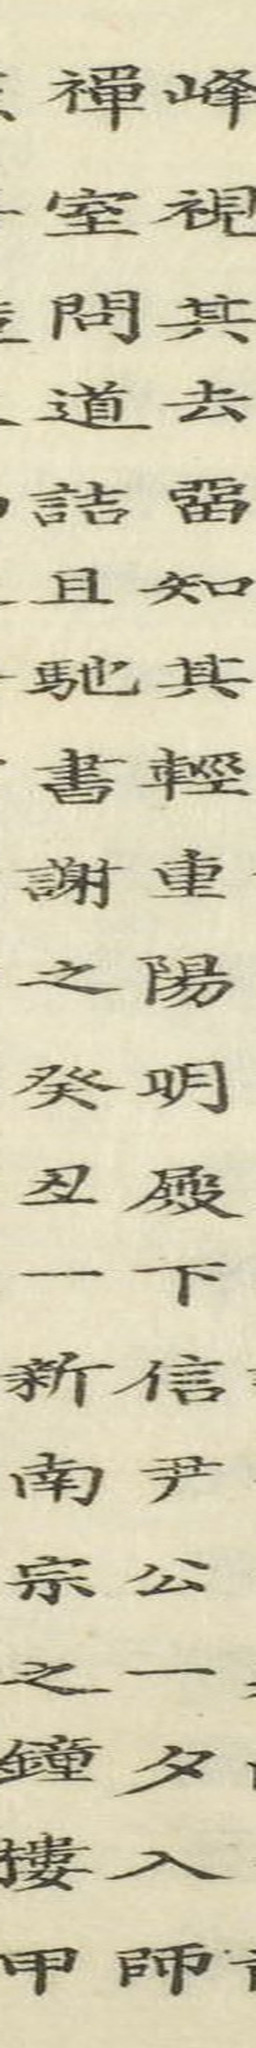禪室問道詰且馳書謝之癸丒一新南宗之鐘樓甲
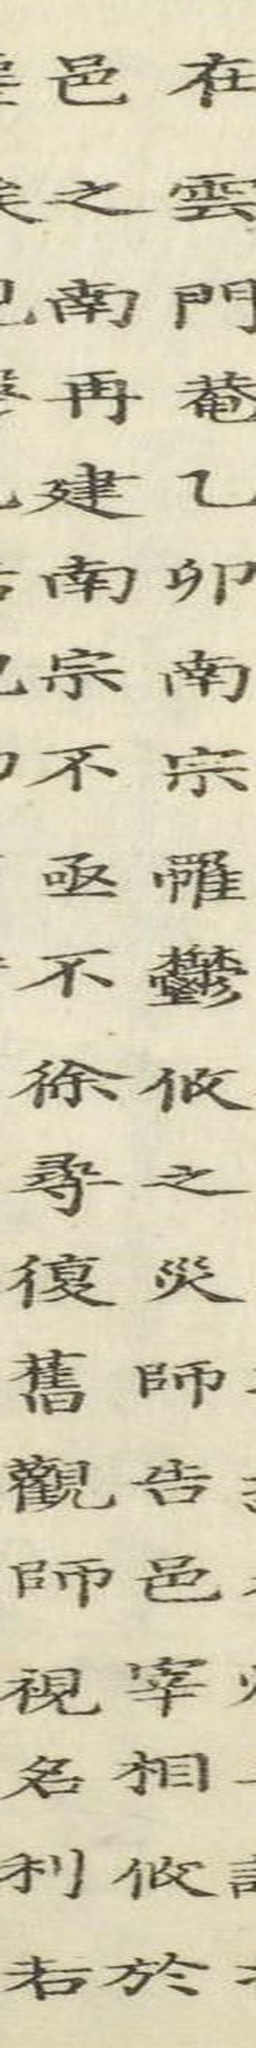邑之南再建南宗不亟不徐尋復𦾔觀師視名利
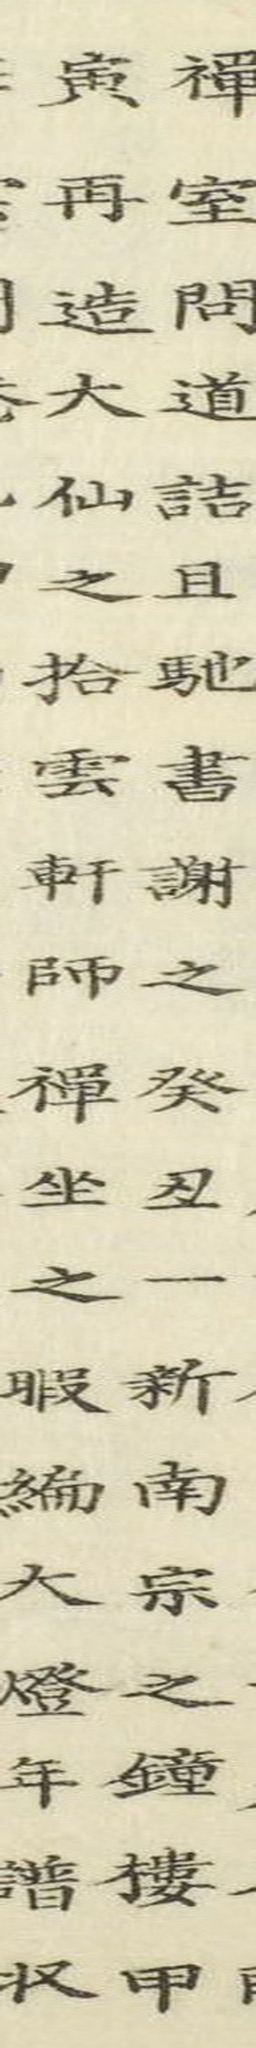寅再造大仙之拾雲軒師禪坐之暇編大燈年譜収
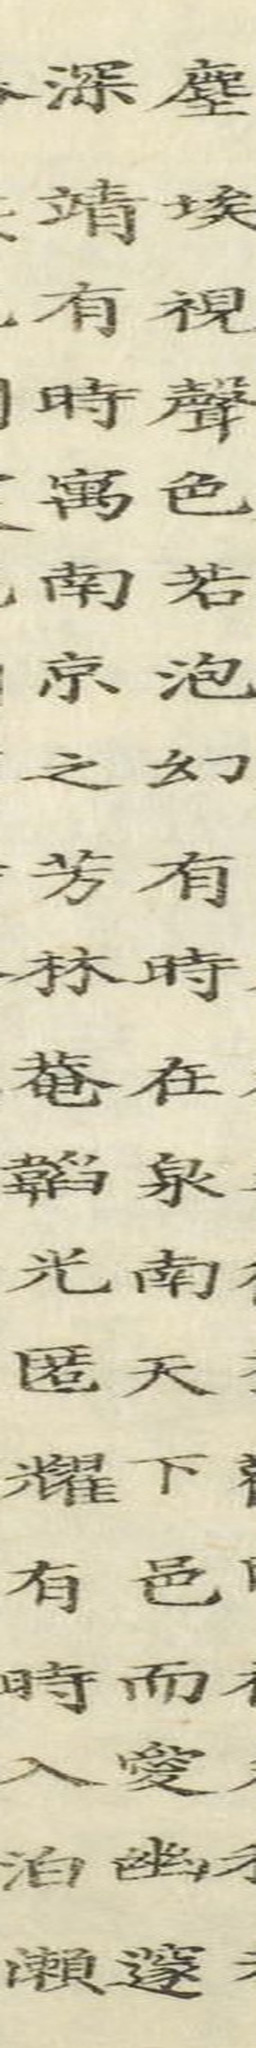深靖有時寓南京之芳林菴韜光匿耀有時入泊瀬
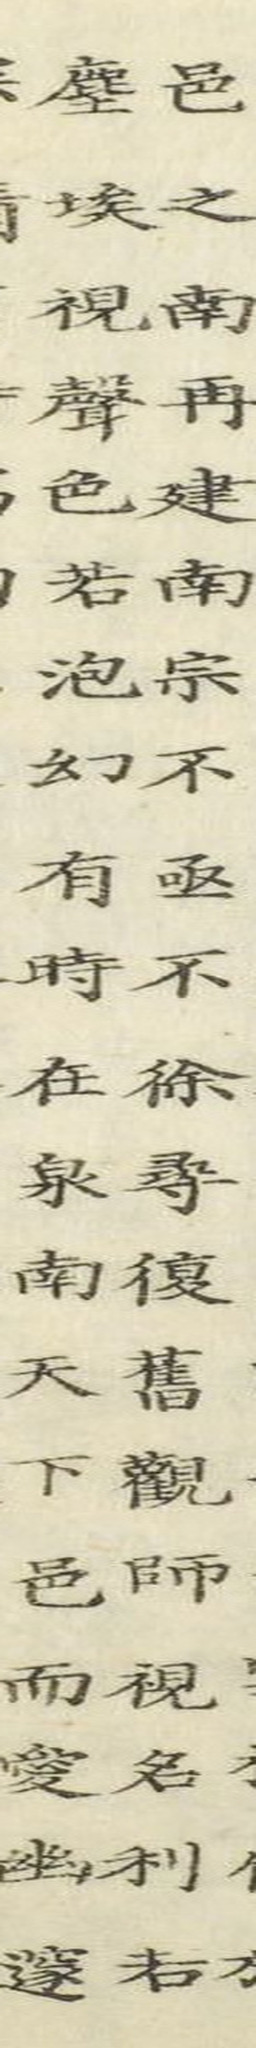塵埃視聲色若泡幻有時在泉南天下邑而愛幽䆳
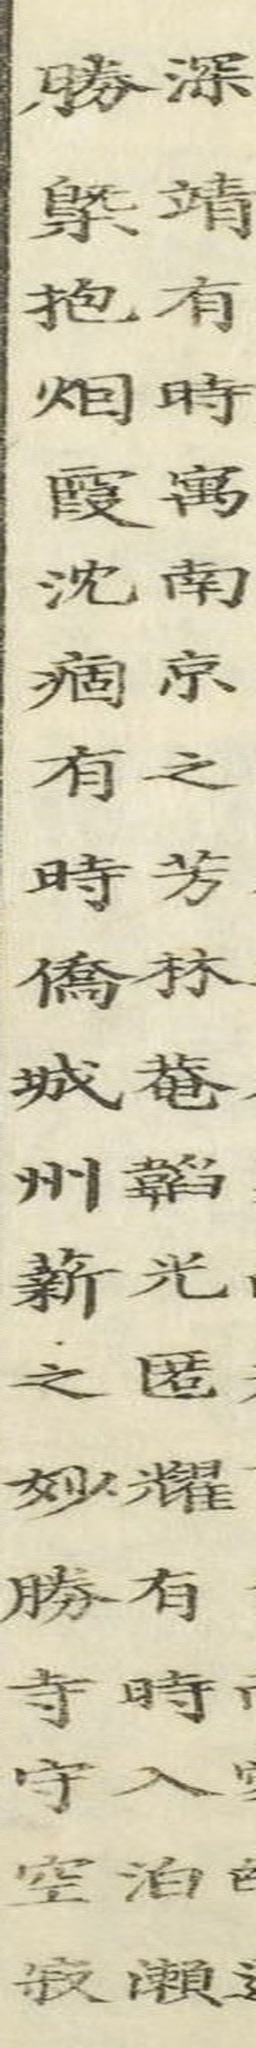勝槩抱𤇆霞沈痼有時僑城州薪之妙勝寺守空寂
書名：江戸名所図会 20巻 巻之4
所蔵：東京学芸大学教育コンテンツアーカイブ
